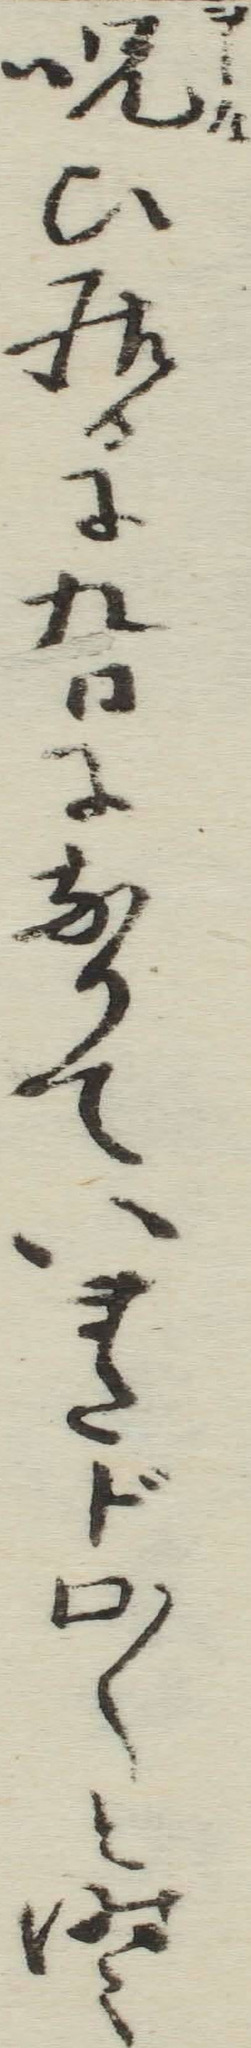呪い居るに九日になりていまたドロ〳〵と時々
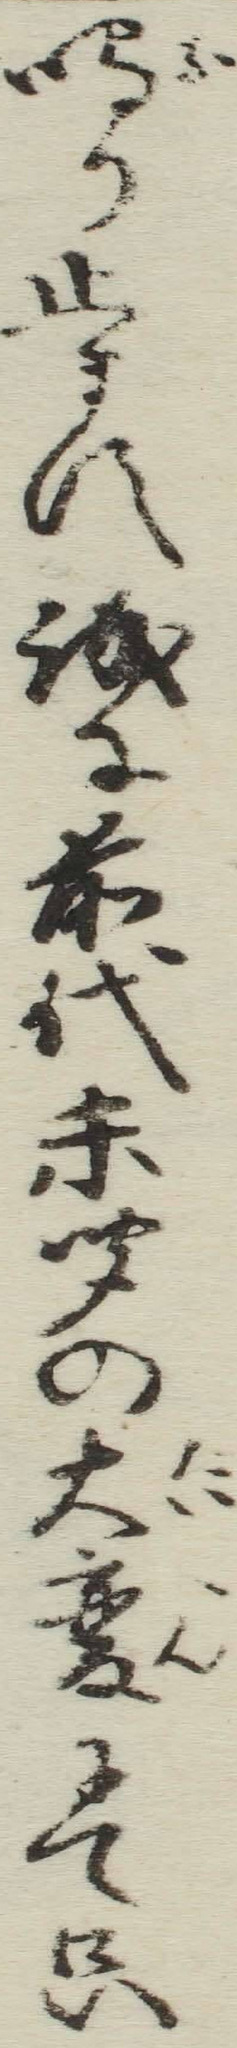鳴り止まず誠に前代未聞の大変にて只
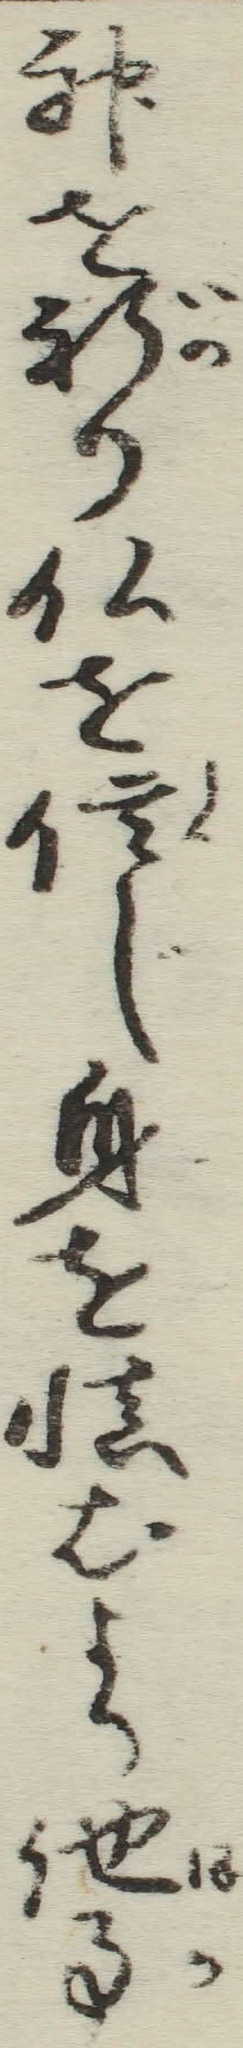神を祈り仏を信じ身を慎むより他事
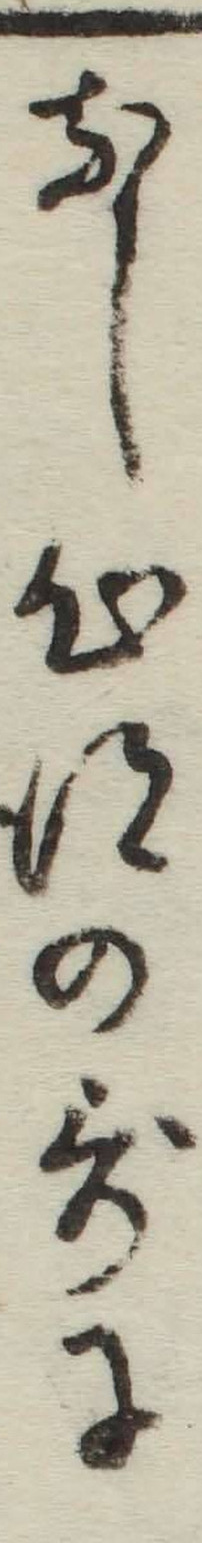なし心得の歌に
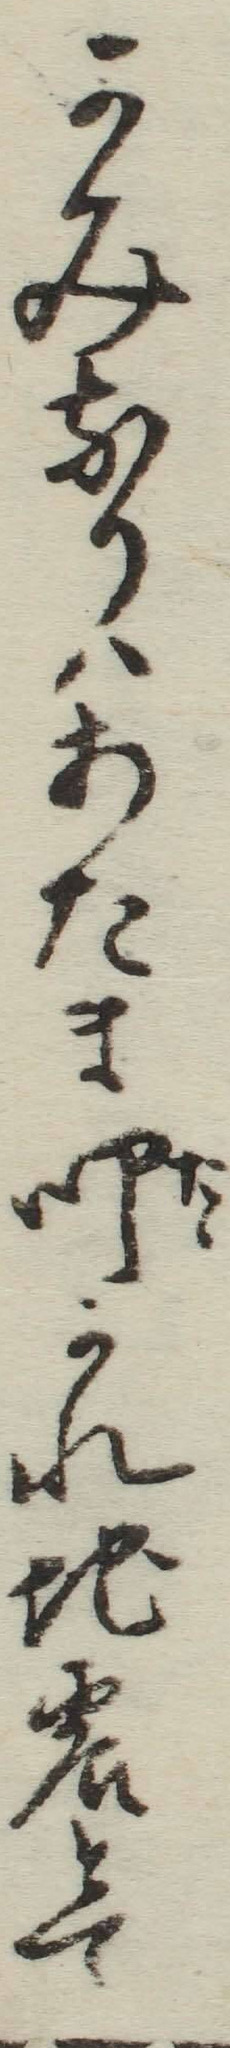かみなりはあたま叩かれ地震とて
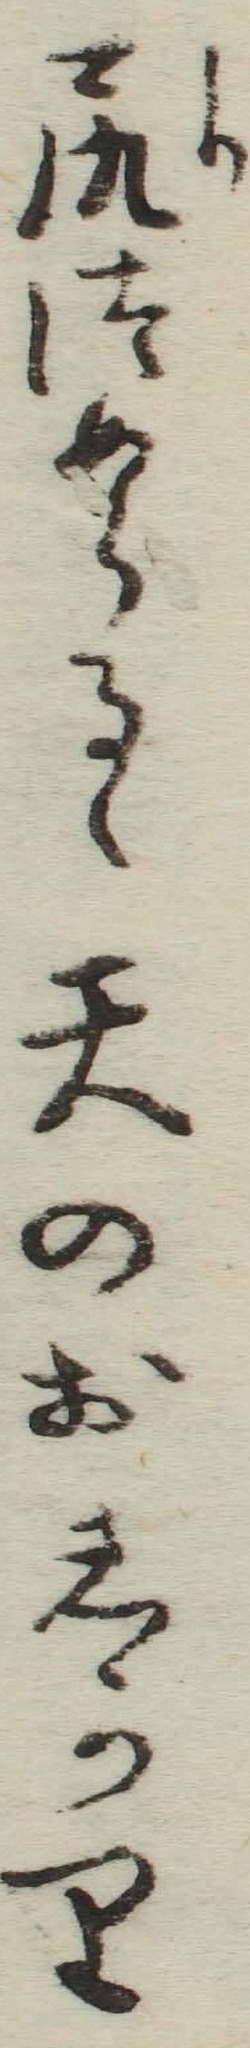尻つめらるゝ天のおしかり

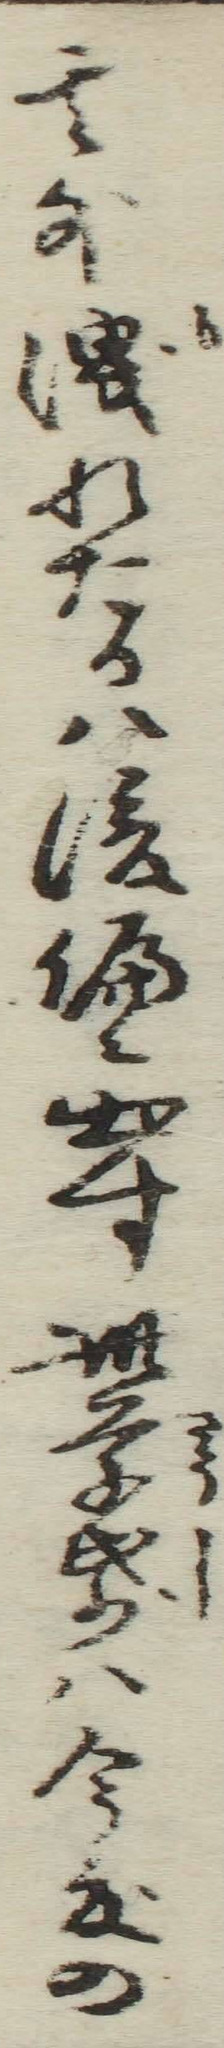其外洩れたるは後偏に出す此草紙は今度の
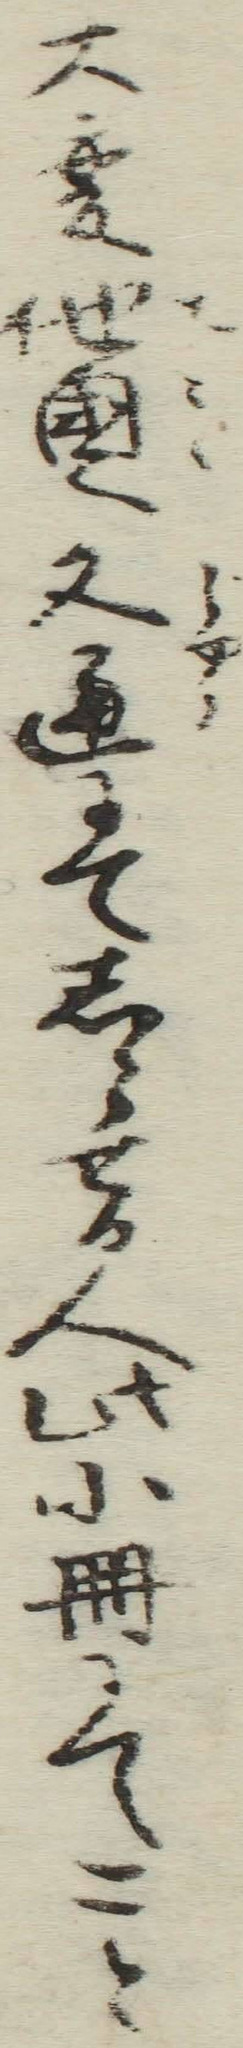大変他国へ文通にてしらせる人此小冊にてこと
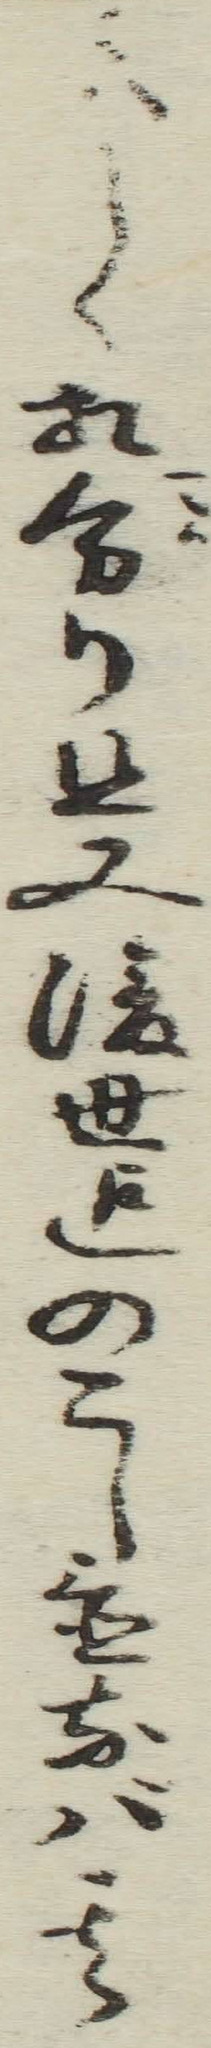くはしく相分り且又後世迄のこし置なば其
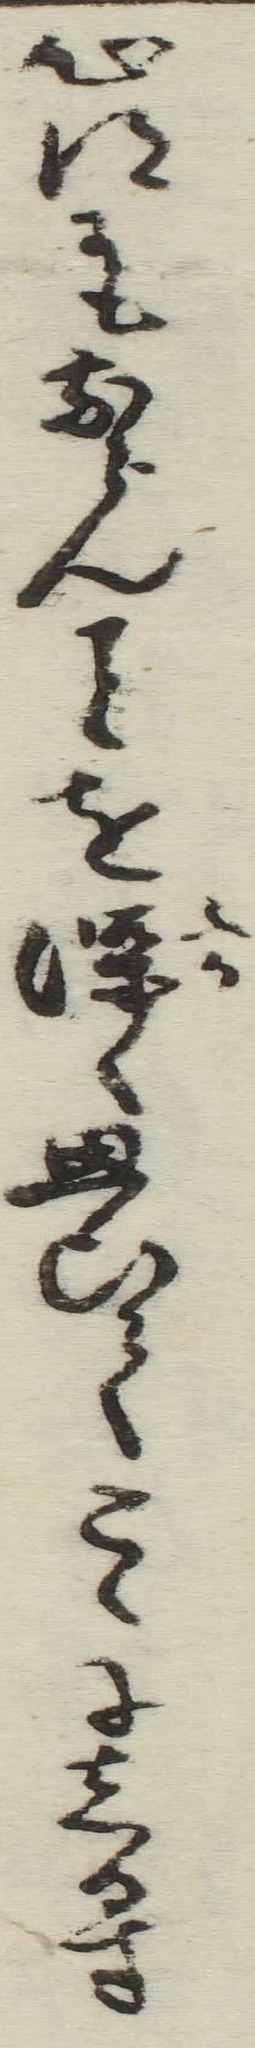心得にもならんことを深く思ひてこゝにしるす

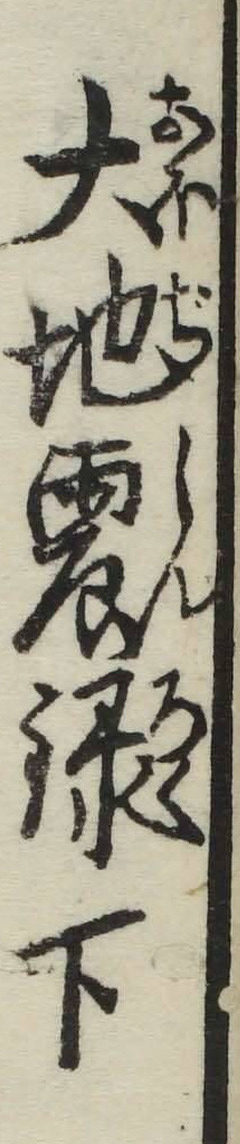大地震録下
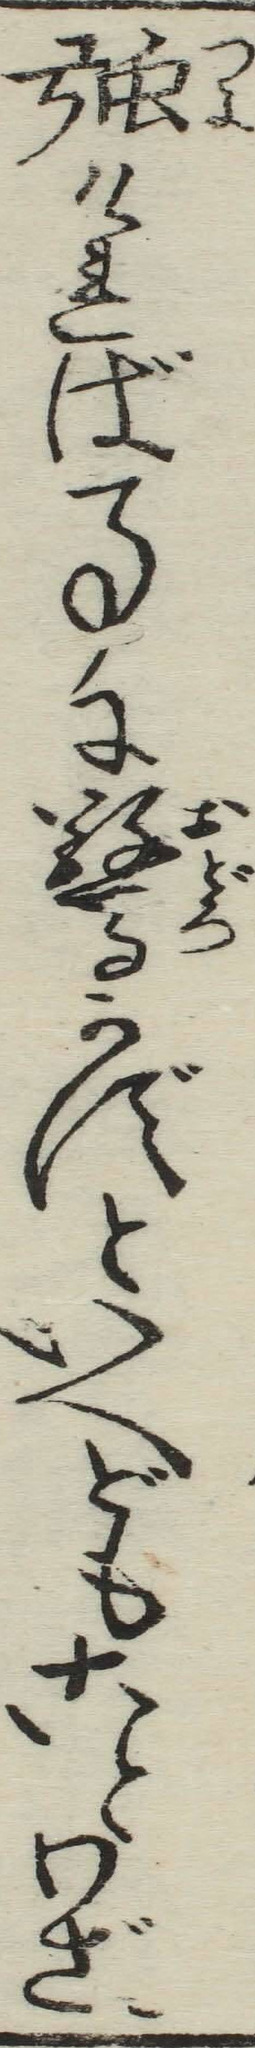強ければ事に驚かずといへどもことわざ
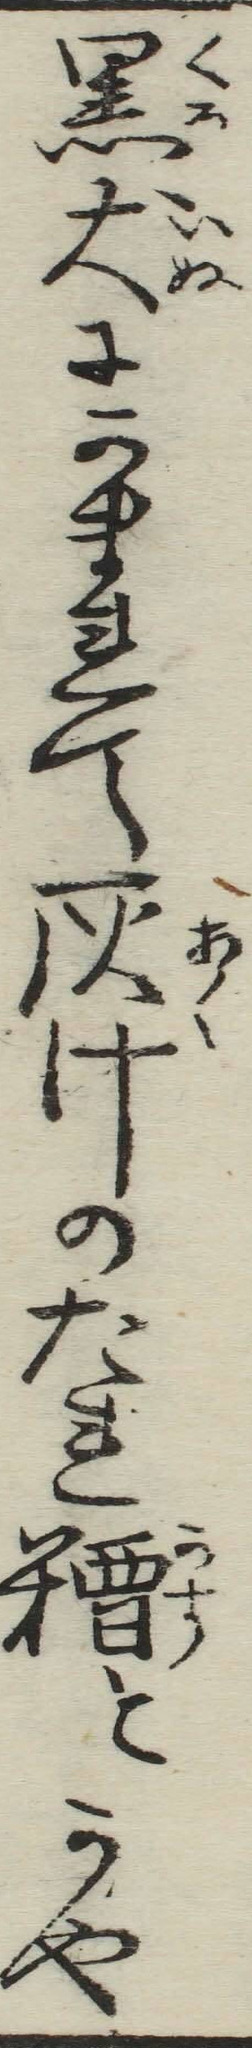黒犬にかまれて灰汁のたれ糟とかや
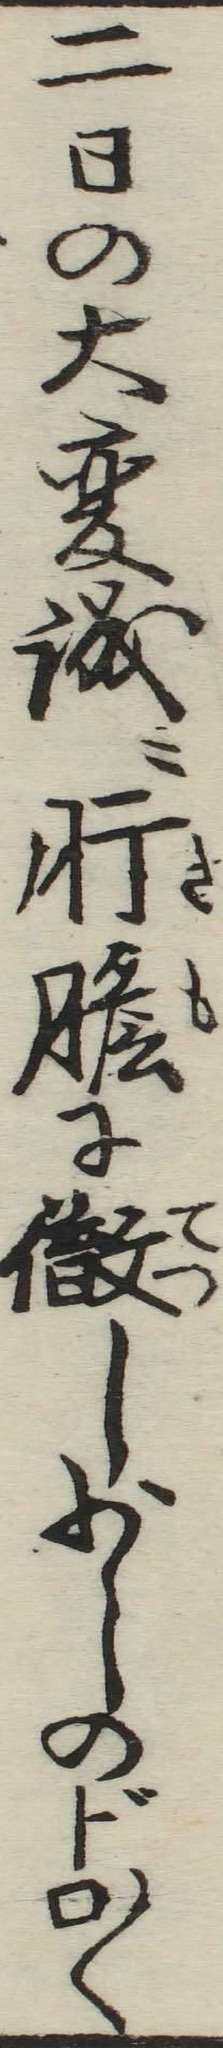二日の大変誠ニ肝膽に徹し少しのドロ〳〵
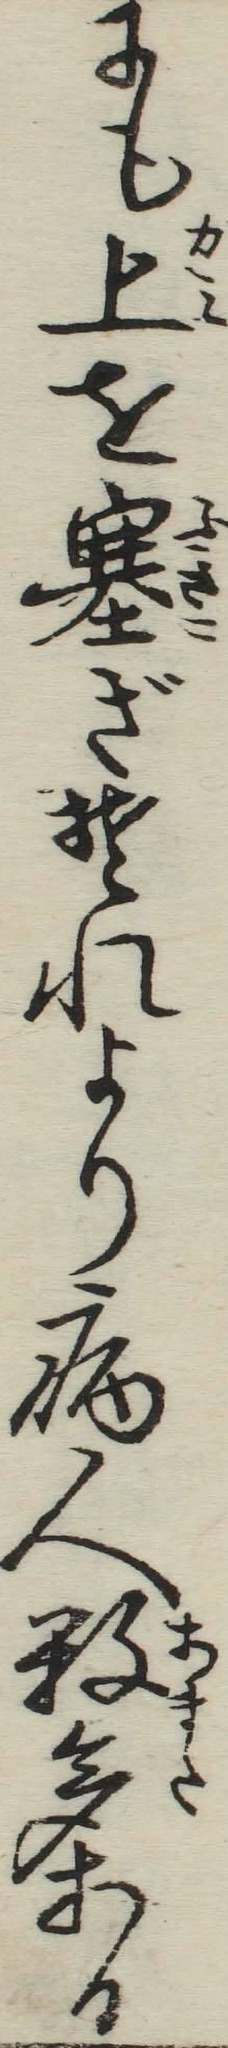にも上を塞ぎそれより病人数多ある
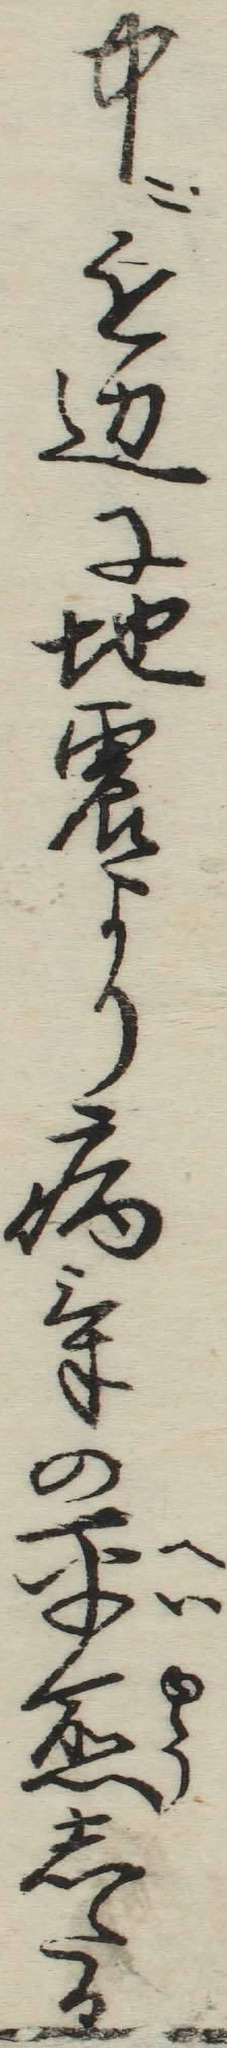中ニ近辺に地震より病気の平癒したる
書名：地震奇談／平安万歳楽
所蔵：国文学研究資料館
